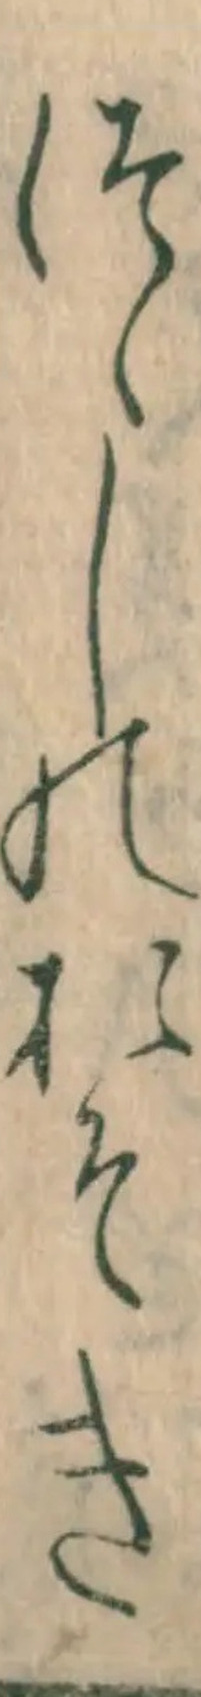つゝしのおそき
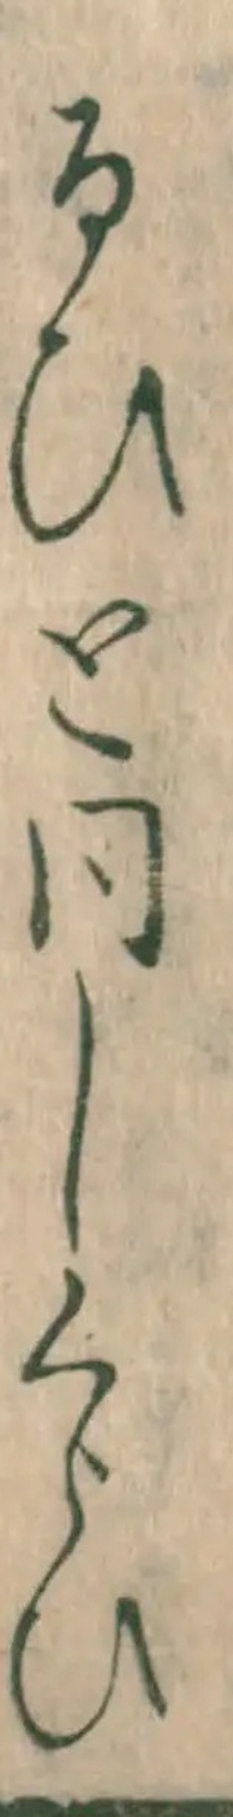るひと同しくらひ
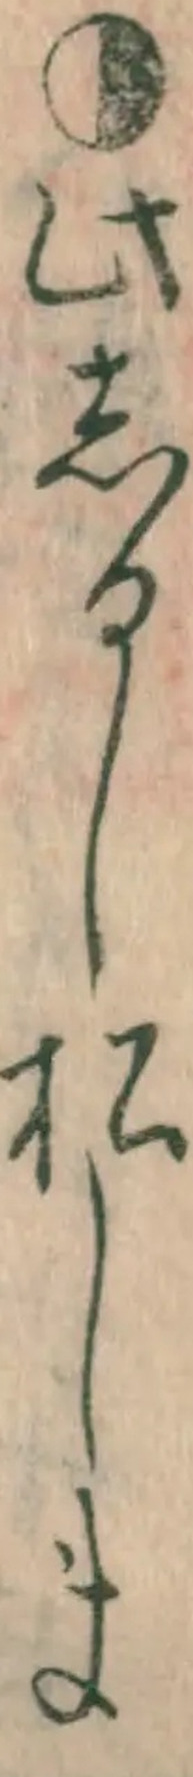此しるし松しま
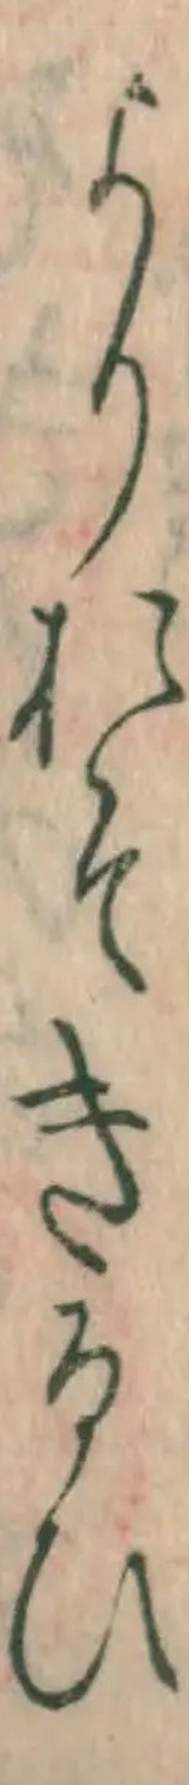よりおそきるひ
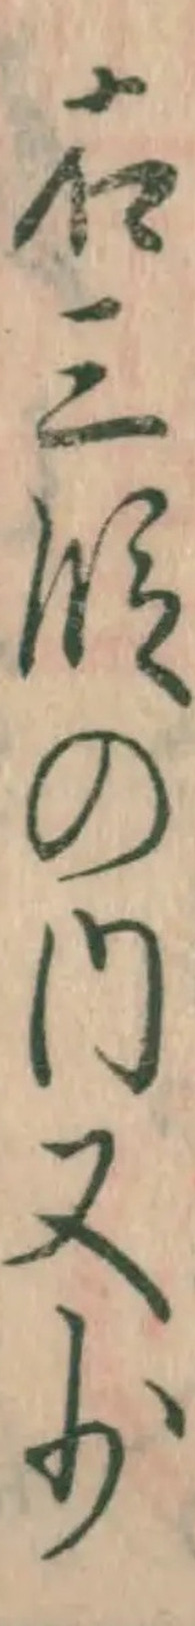右三段の門又少
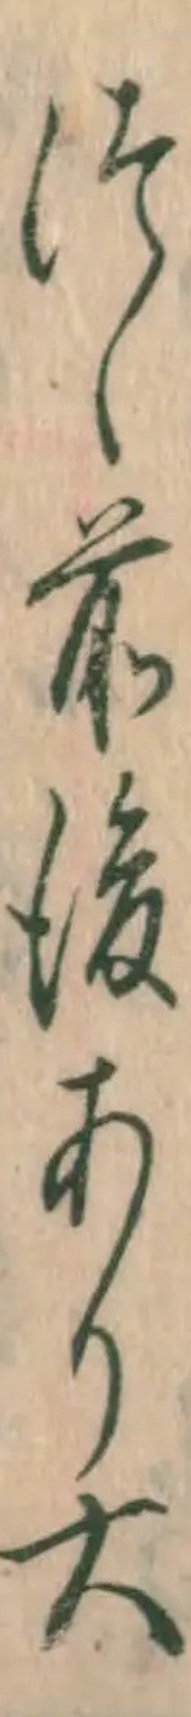つゝ前後あり大
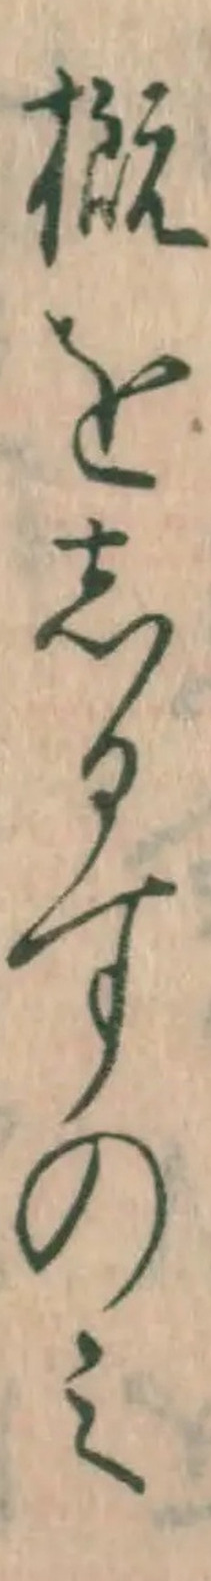概をしるすのみ
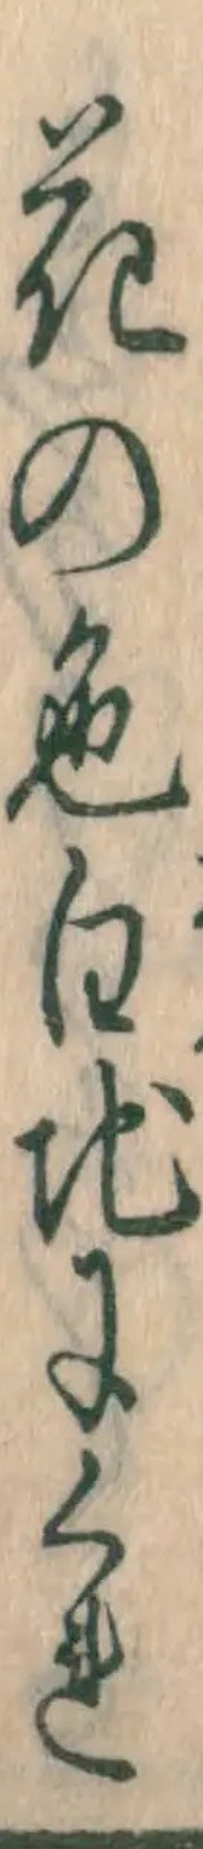花の色白地にくれ
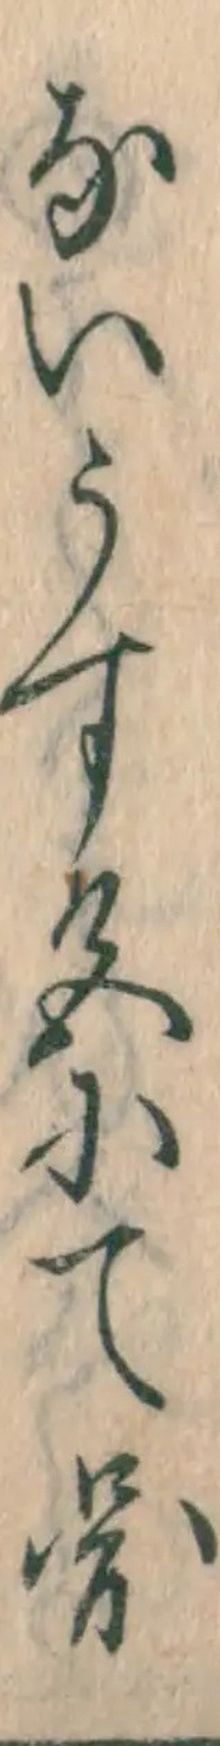ないうす色にて図

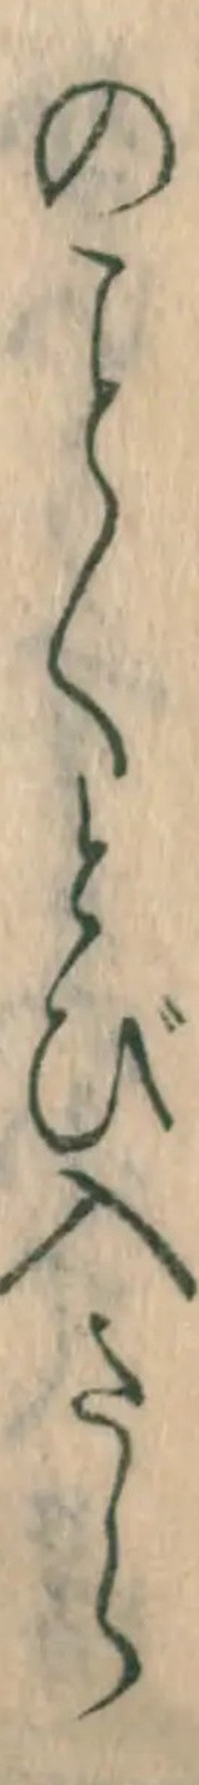のことくとび入さら
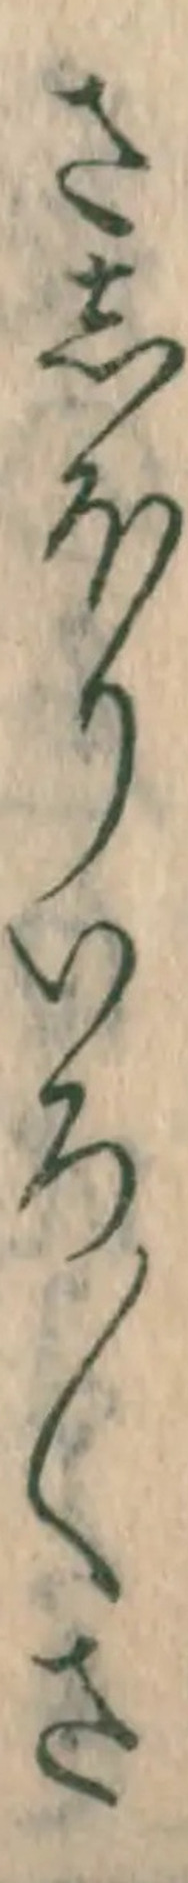さしぼりいろ〳〵さ
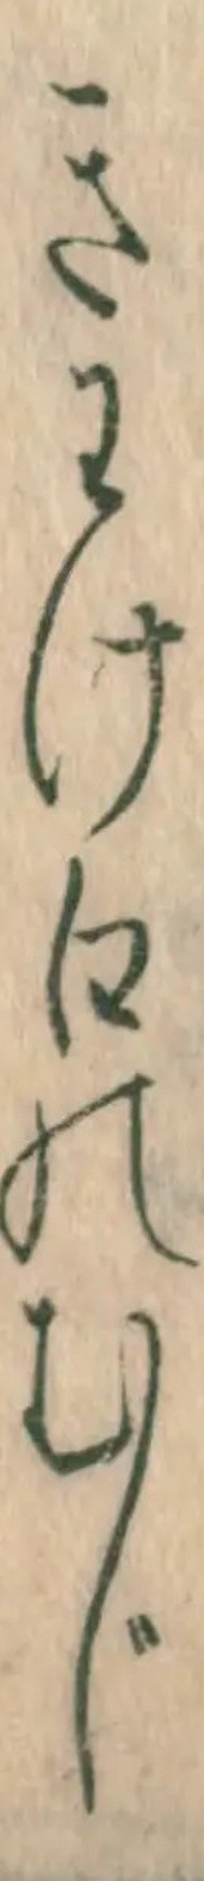きわけ白のむじ
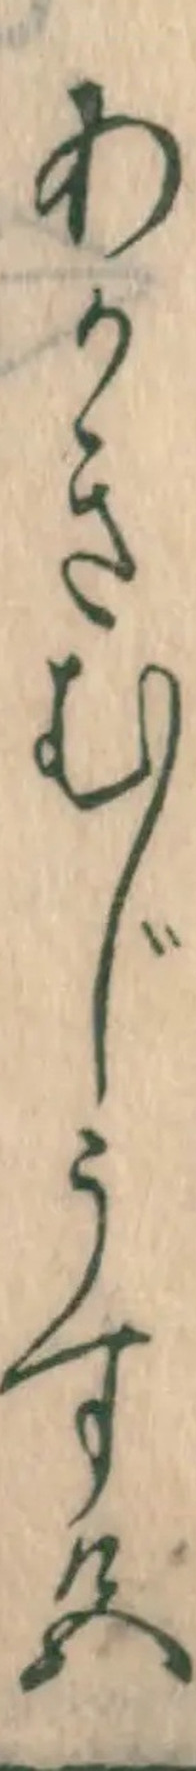ありきむじうす色
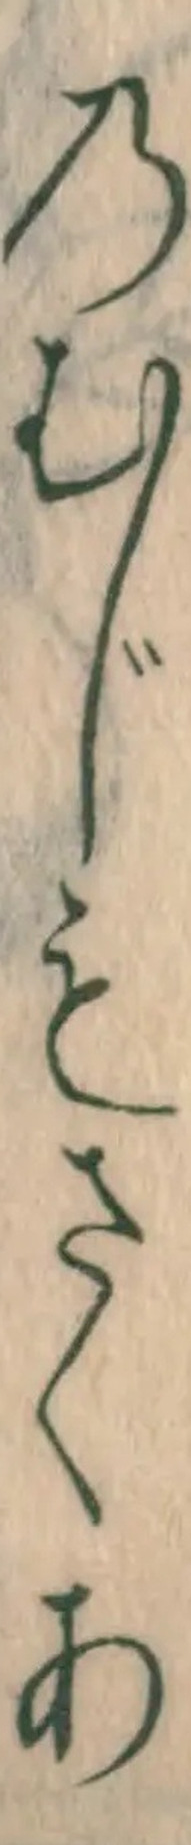のむじもさくあ
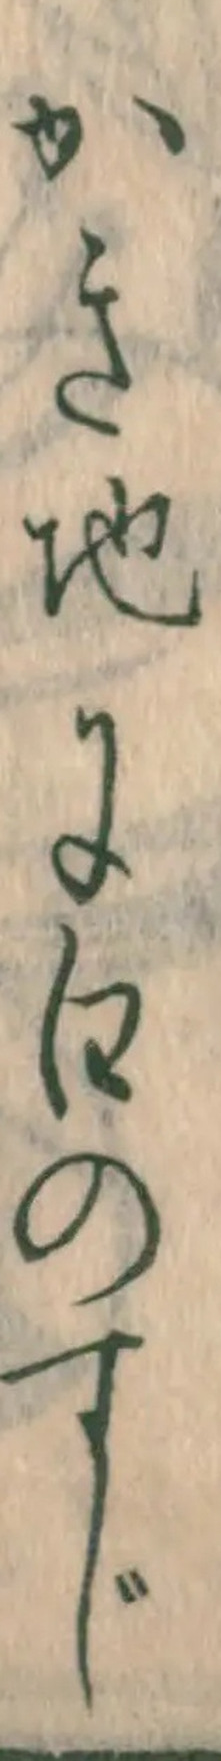かき地に白のすじ
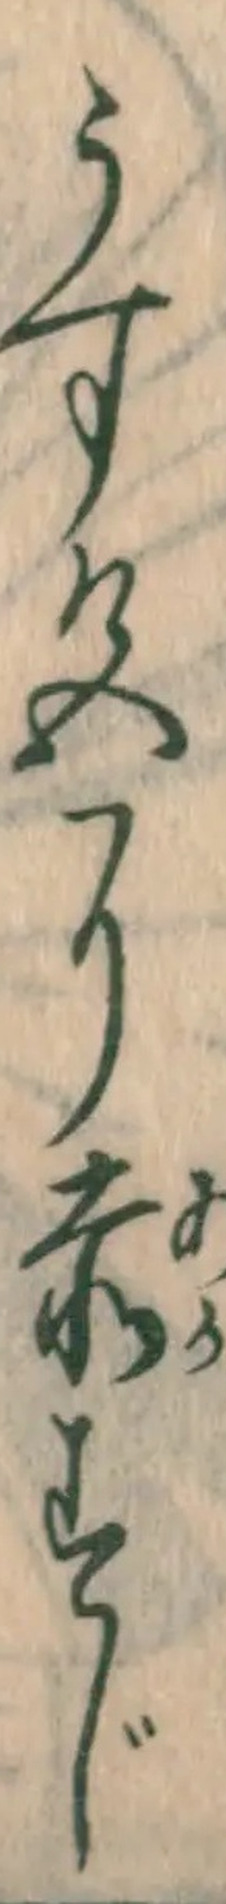うす色に赤すじ
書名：錦繍枕 5巻. [4]
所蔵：国立国会図書館 National Diet Library, JAPAN
